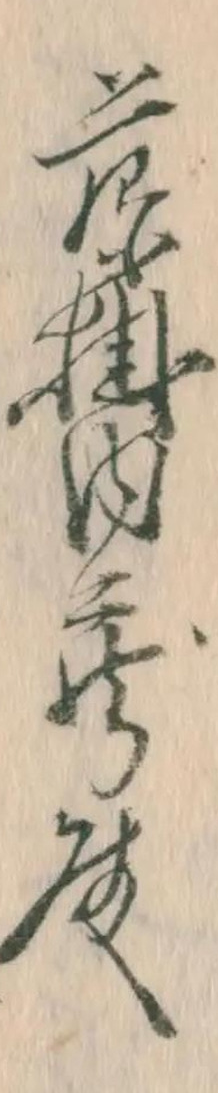藤掛内蔵殿
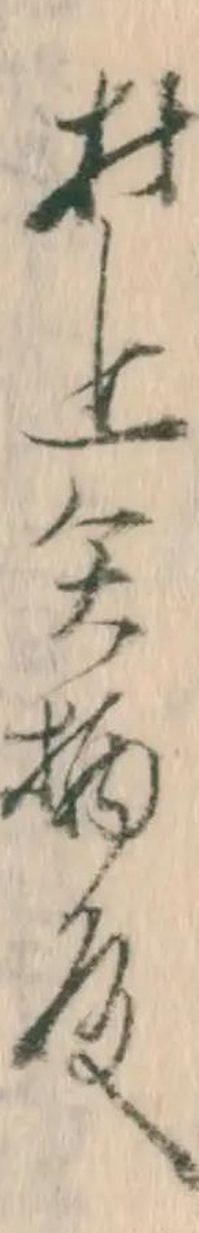村上矢柄殿
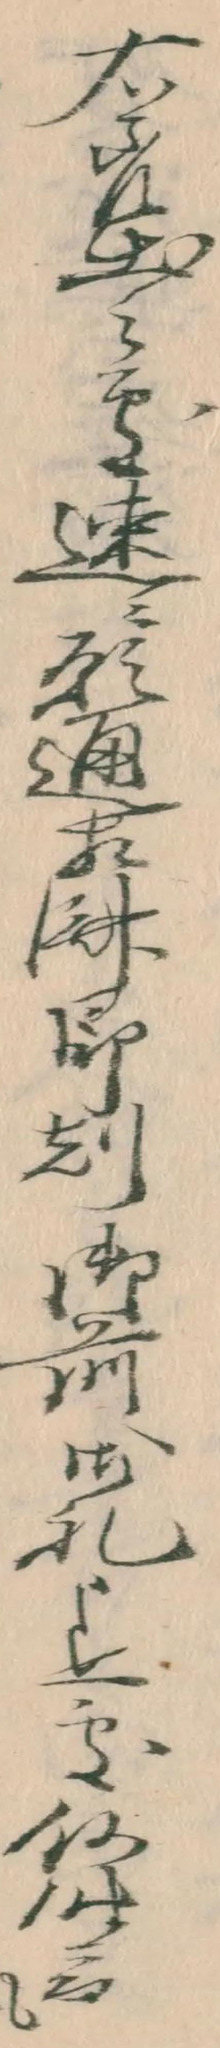右差出之處速ニ願通相済即刻御前へ御礼申上處何時ニ而も
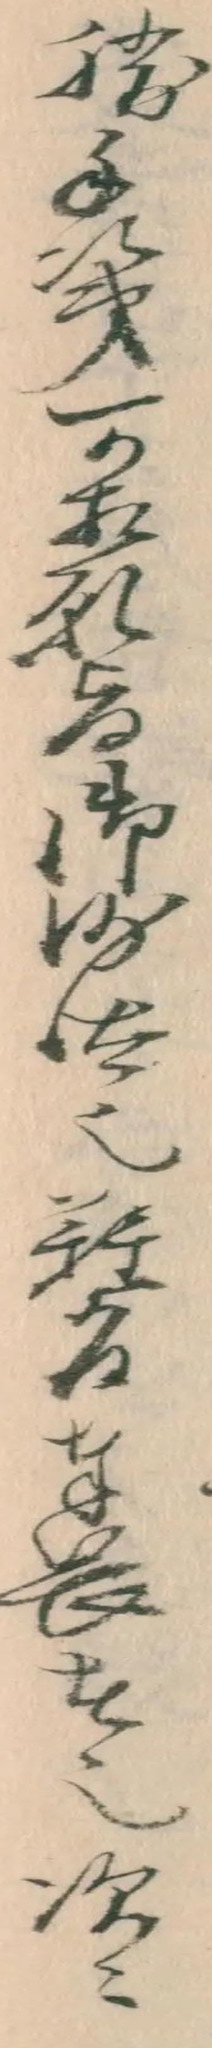勝手次第可相願旨御沙汰也難有奉畏者也次ニ
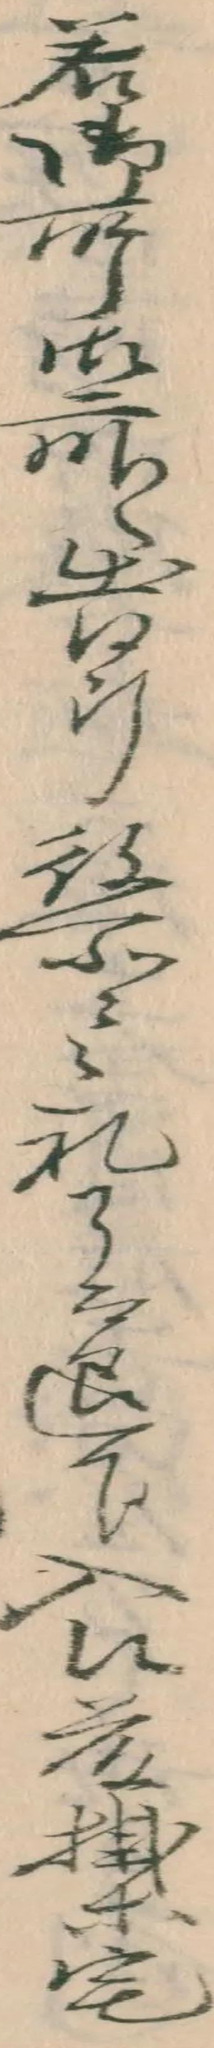若御所御前へ出同断致所々御礼了而退下入江藤掛等宅
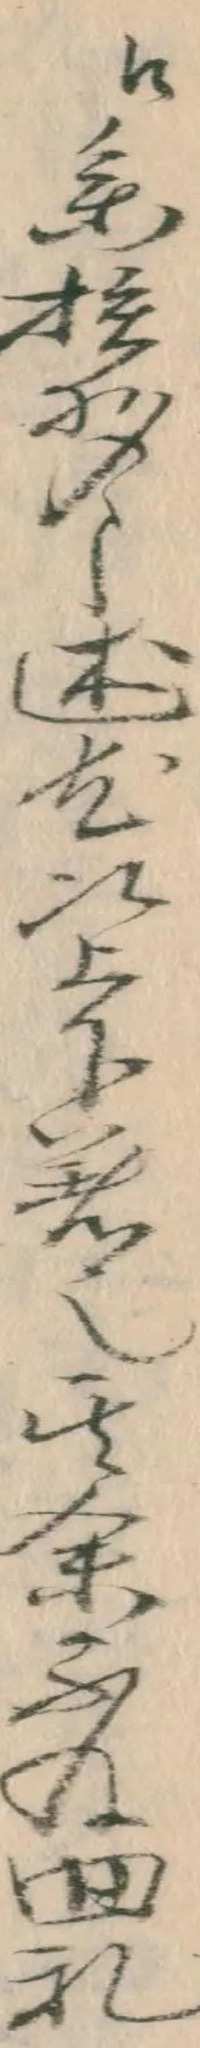え参挨拶申述尤次上下着也其余不及回礼
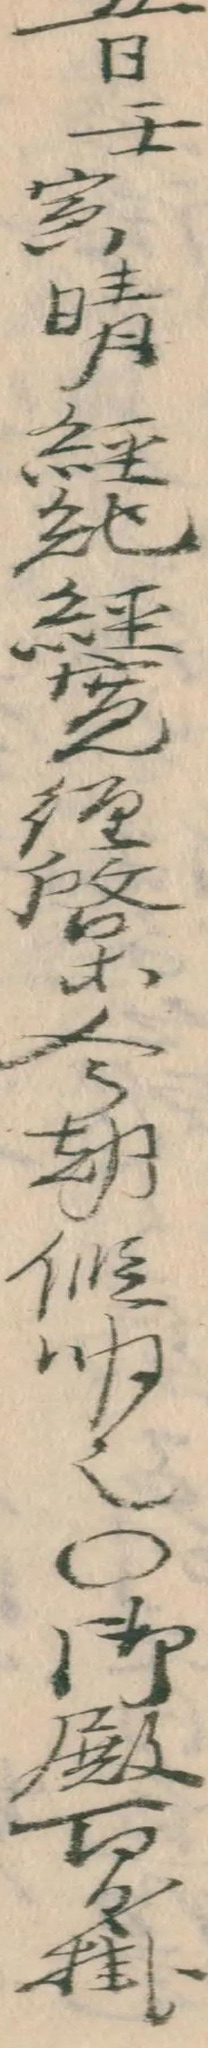五日壬寅晴経紀経寛経啓等今朝假明也○御殿百ゟ掛
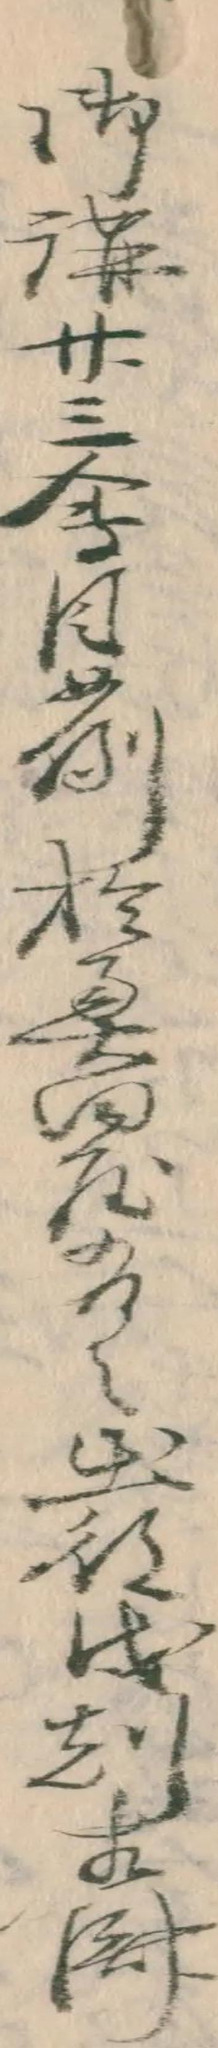御講廿三會目如例於奥田屋有之出役戌刻相済
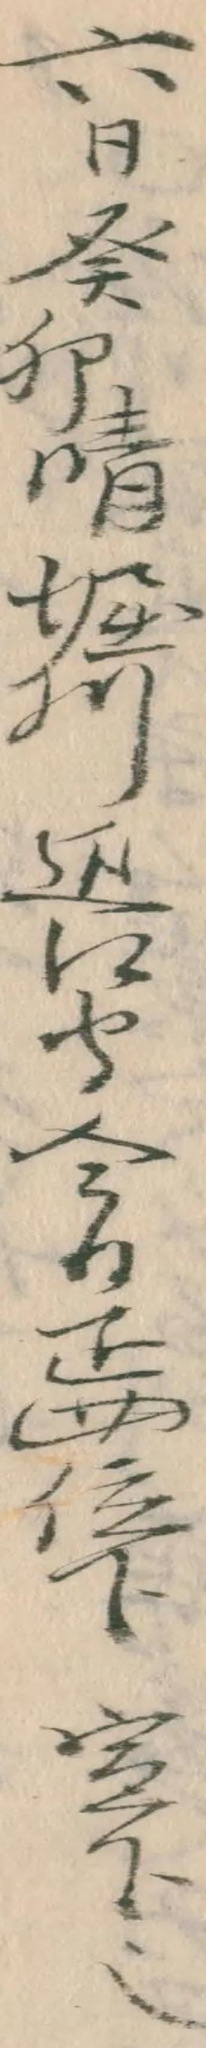六日癸卯晴堀川近江守今日正四位下宣下也
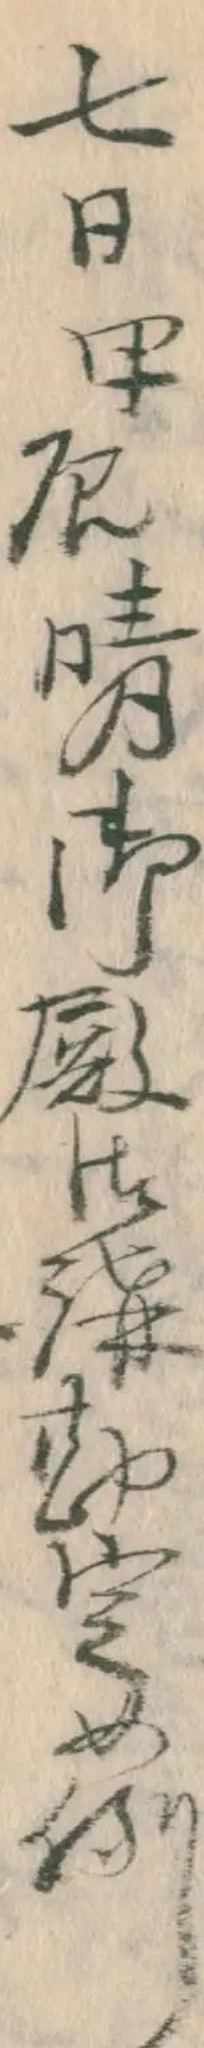七日甲辰晴御殿御講勘定如例
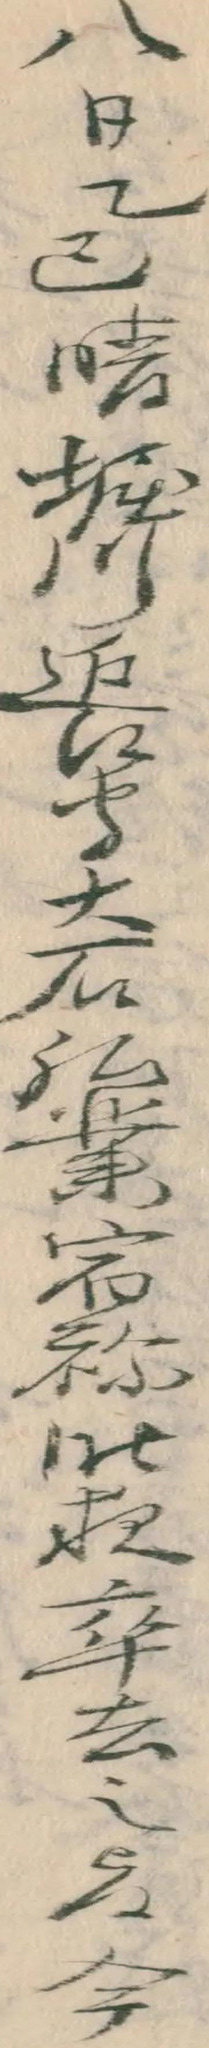八日乙巳晴堀川近江守大石弘業宿祢昨夜卒去之旨今
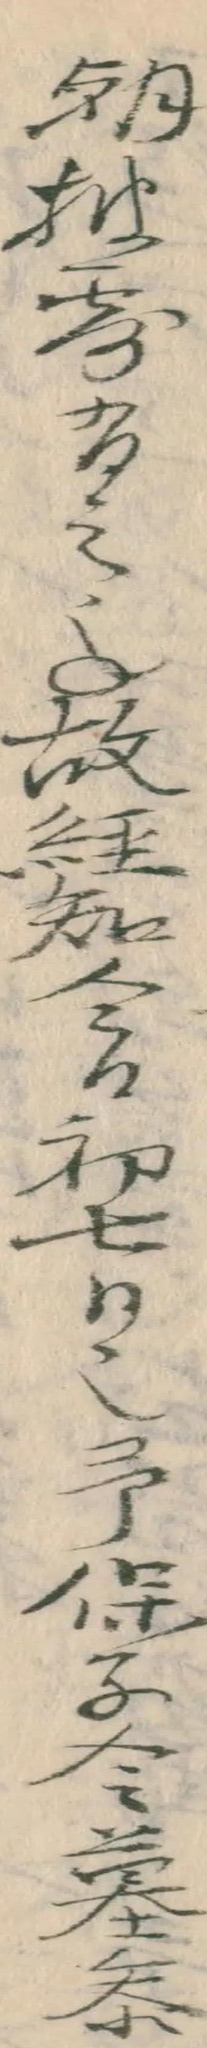朝披露有之也故経知今日初七日也予保子令墓参
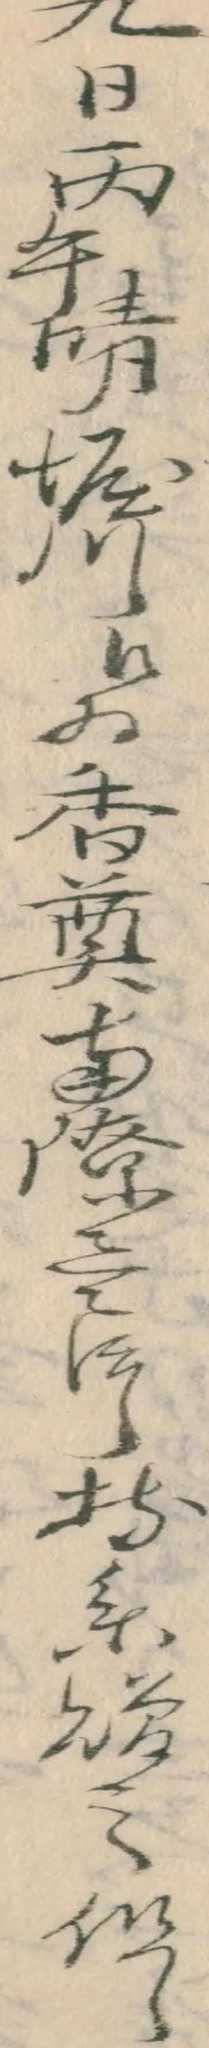九日丙午晴堀川え為香奠南鐐壱片持参贈之但し
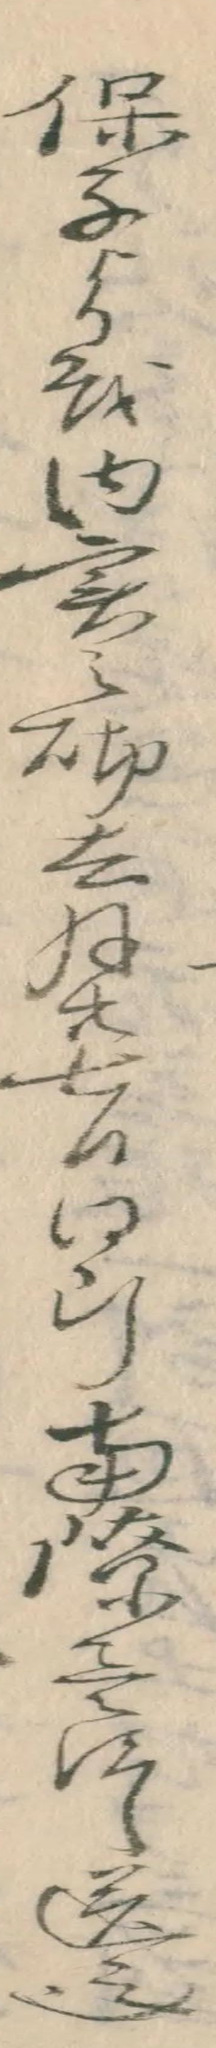保子よりも内実之砌去月廿七日同断南鐐壱統之送迄
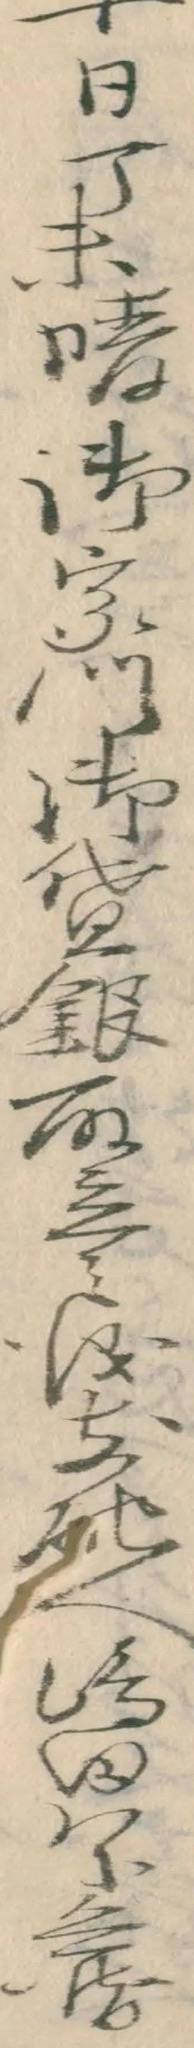十日丁未晴御家門御貸銀取立之儀支配人嶋田八郎兵衛
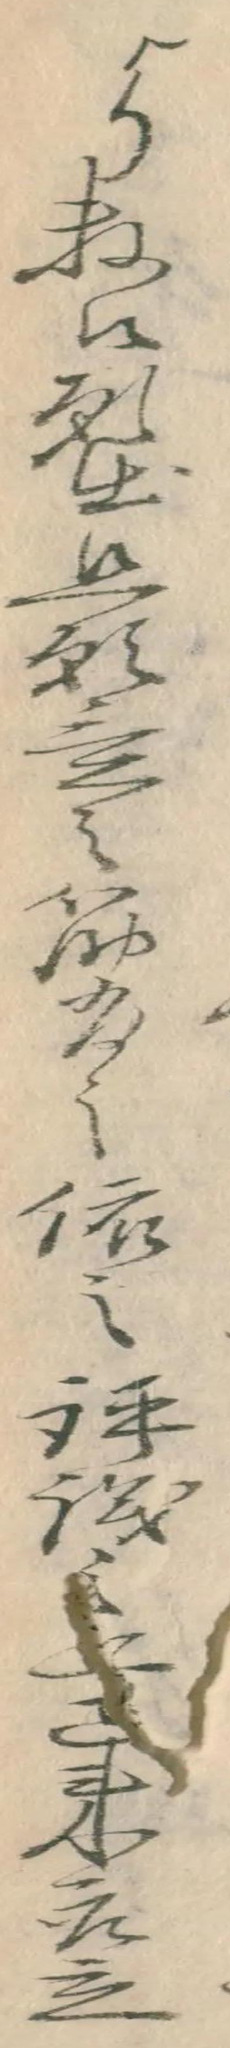より数日願出且願意之筋有之依之評議之上已来取立
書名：賀茂社記録. 第66冊
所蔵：国立国会図書館 National Diet Library, JAPAN
